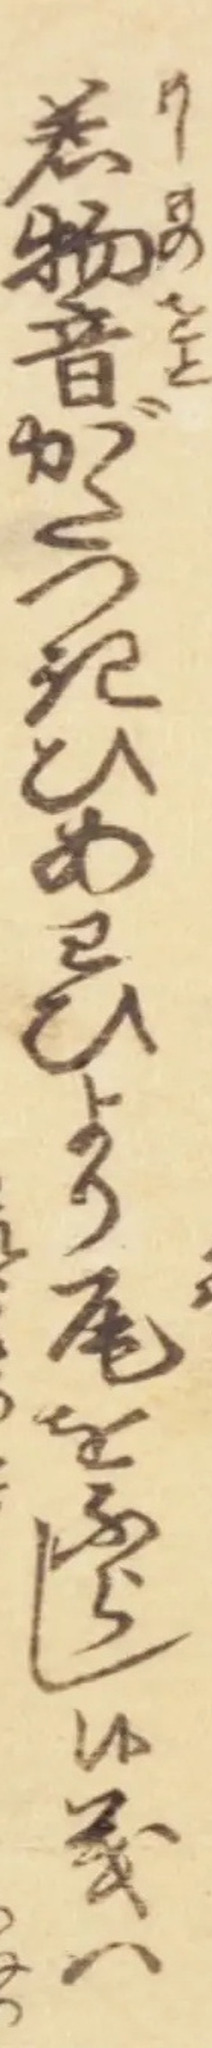若物音がたつきひめわひより瓦をふらし候義は
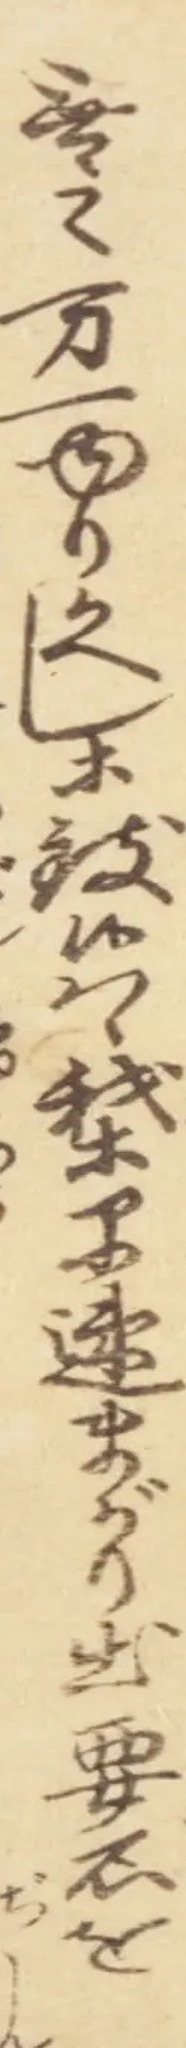無之万一ゆりかへし等致候はゝ我等早速まがり出要石を
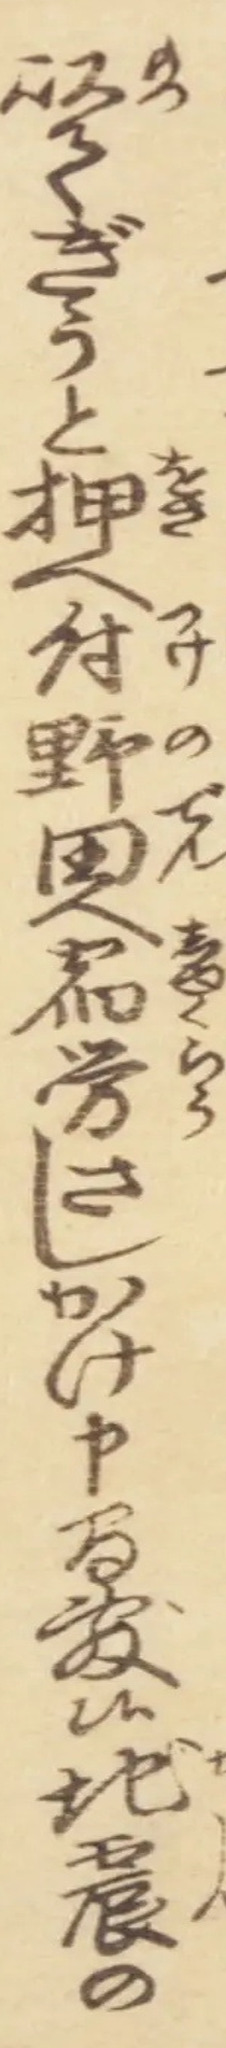以てぎうと押へ付野田へ宿労さしかけ申間敷候地震の
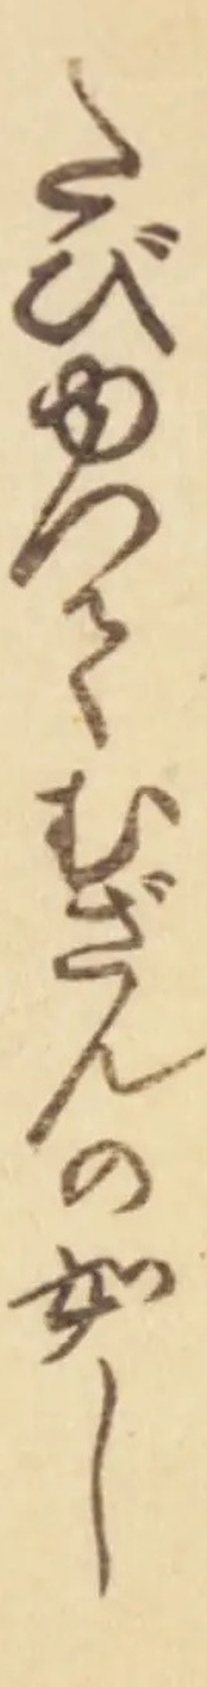たびゆつてむざんの如し
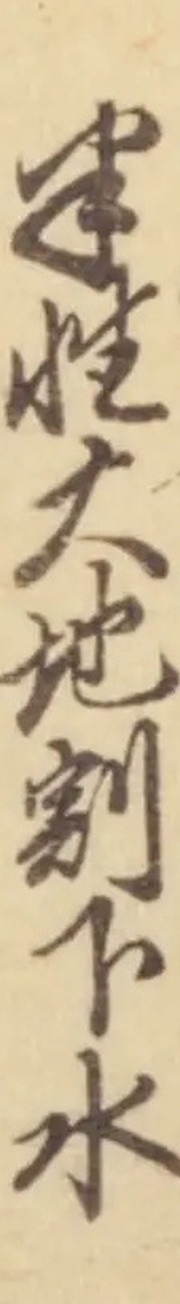半性大地割下水
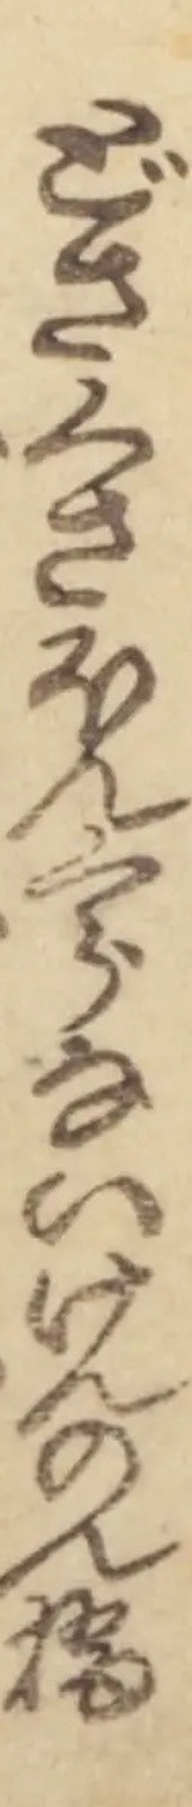どさくさほんくらないけんのん橋
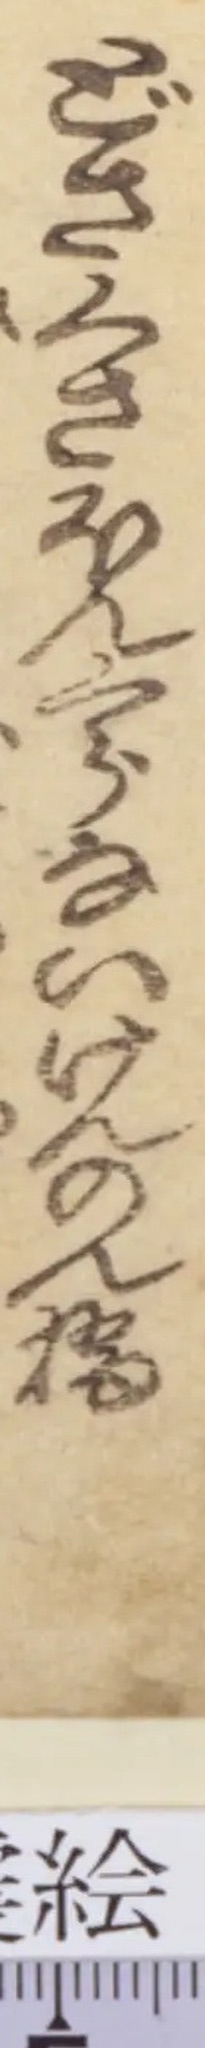どさくさほんくらないけんのん橋
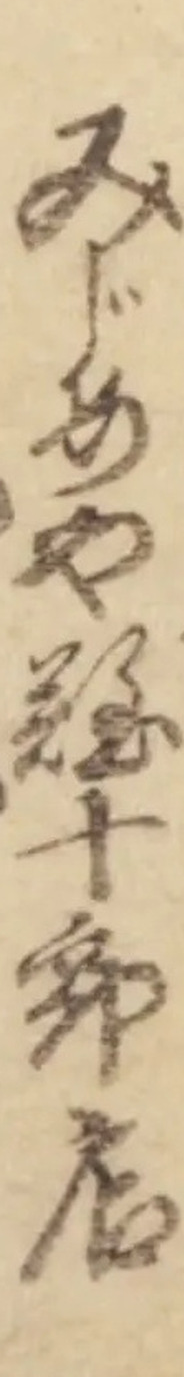みじめや難十郎店
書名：地震方々人迯状之事
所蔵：国立国会図書館 National Diet Library, JAPAN
